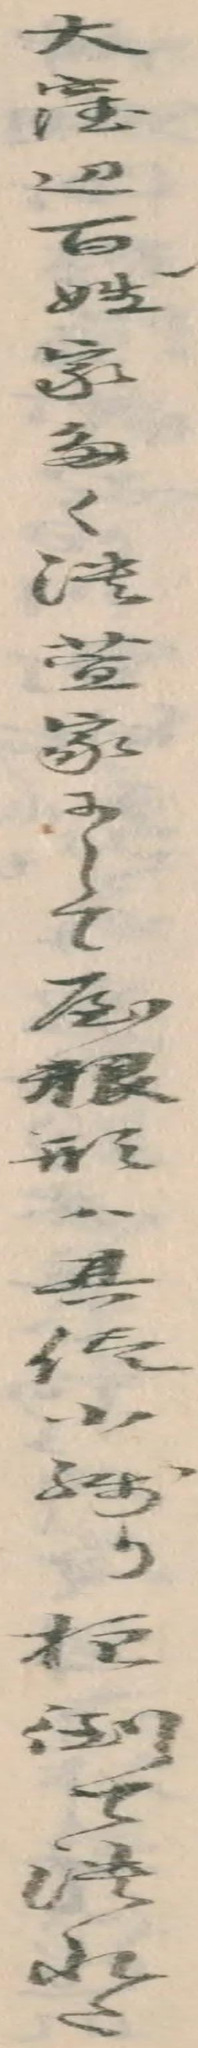大窪辺百姓家多く潰萱家にして屋根形は其侭に残り柱倒て潰れた
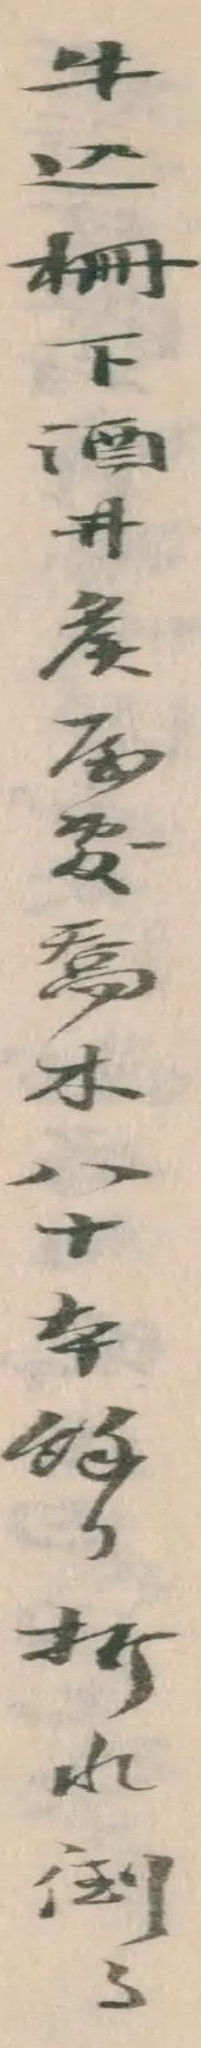牛込棚下酒井侯屋敷喬木八十本余り折れ倒る
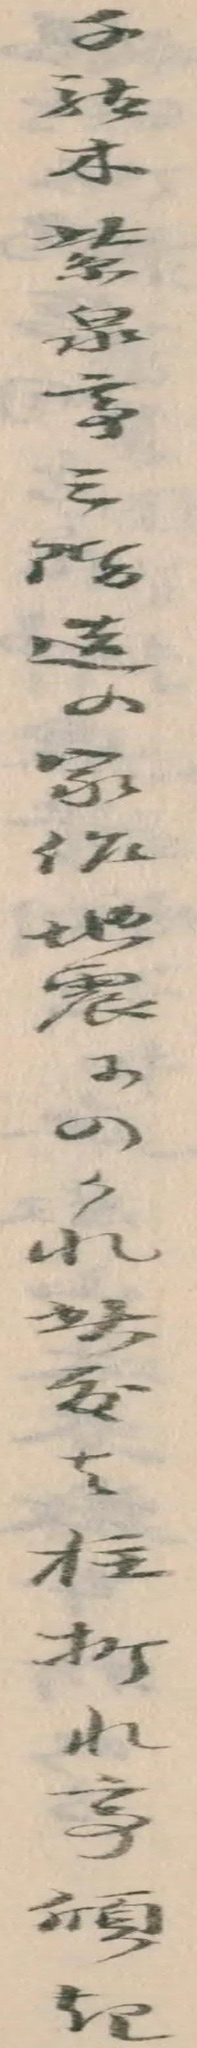千駄木紫泉亭三階造の家作地震にのかれ此度は柱折れて傾き
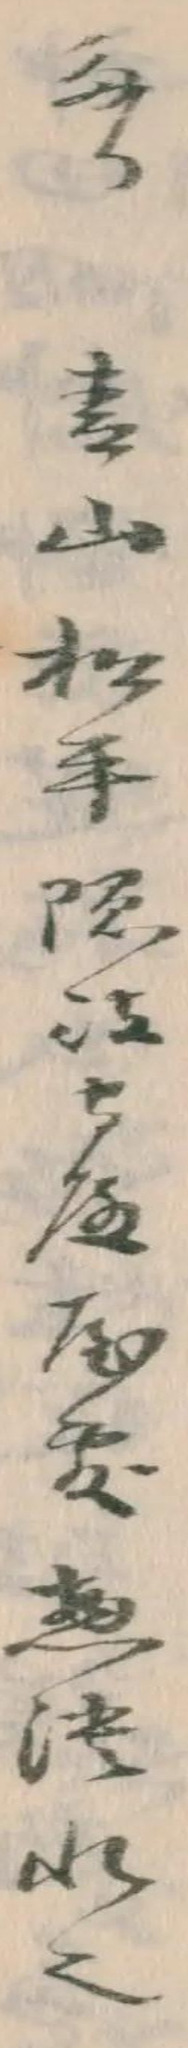たり青山松平隠岐守殿屋敷惣潰れ也
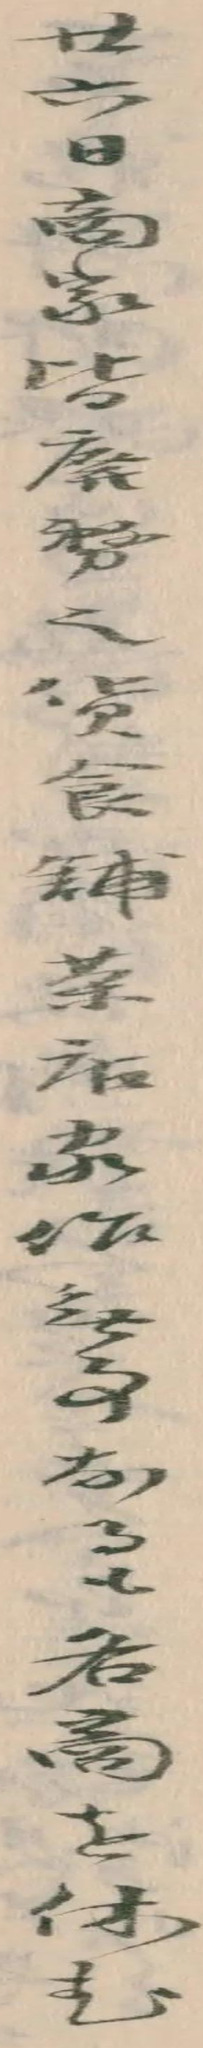廿六日商家皆廃務也貨食舗茶店家作無事なるも各商を休む
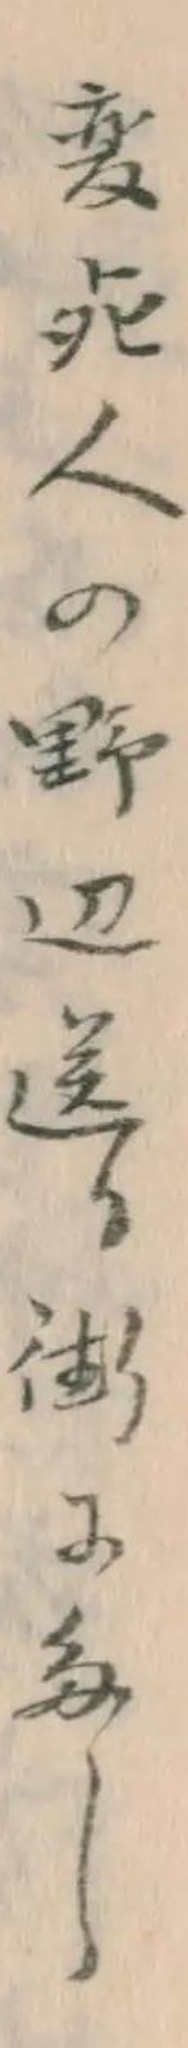変死人の野辺送り街に多し
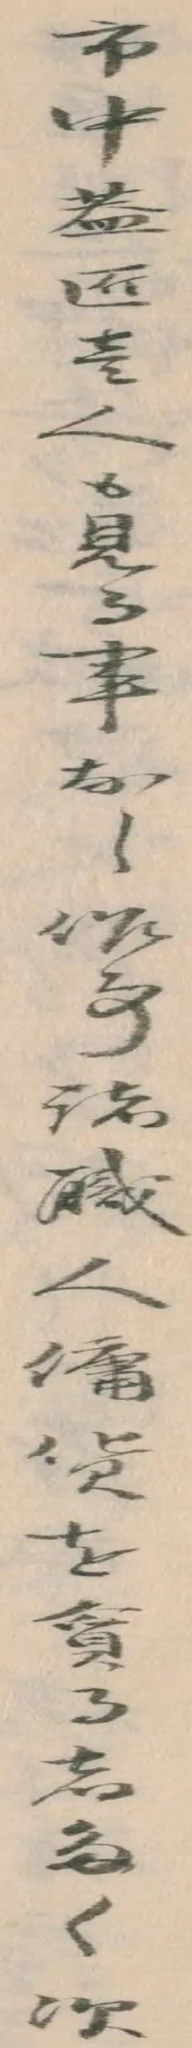市中蓋匠壱人も見る事なし作事諸職人傭貨を貪る者多く次
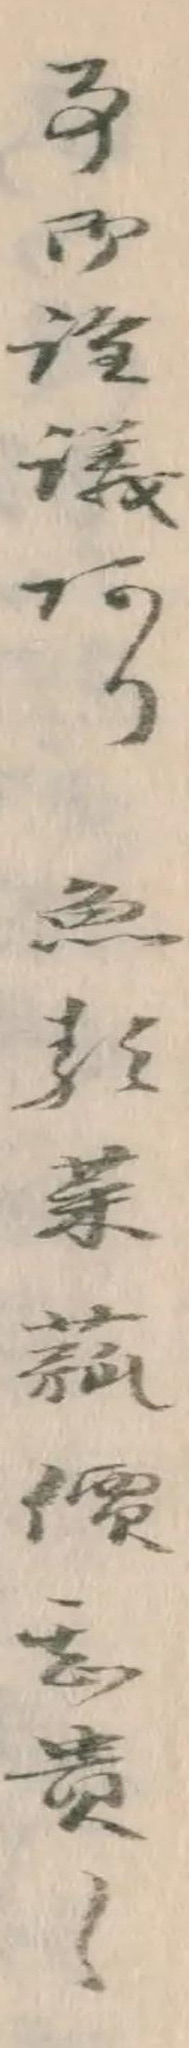事御詮議あり魚類菜菰価悉貴し
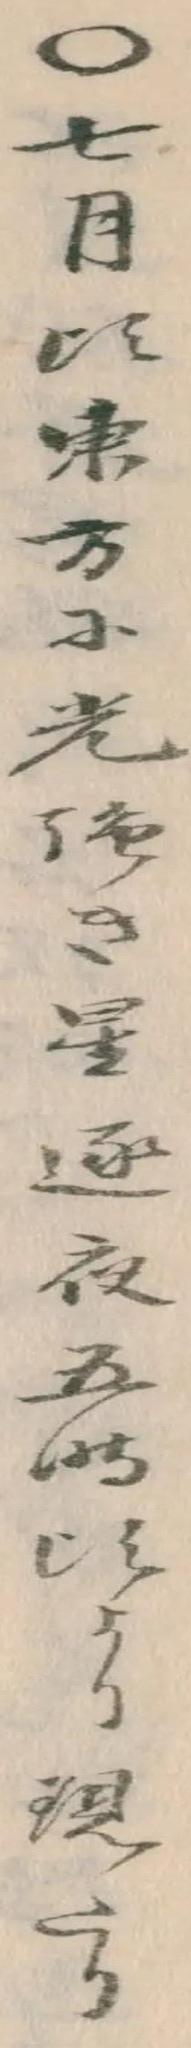〇七月頃東方に光強き星逐夜五時頃より現たり
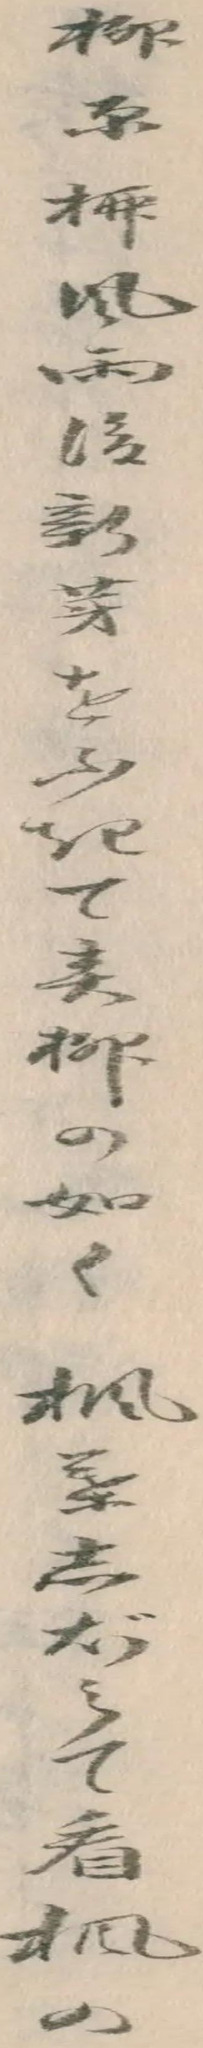柳原柳風雨後新芽をふきて春柳の如く楓葉しぼみて看楓の
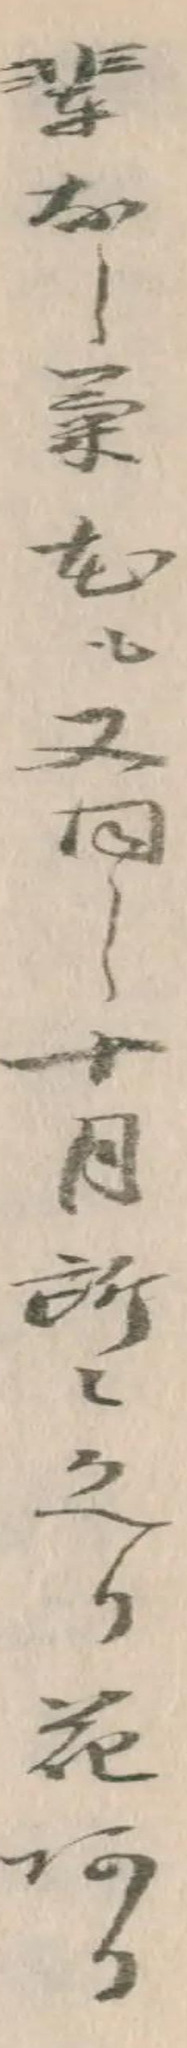輩なし菊花も又同し十月所々かへり花あり
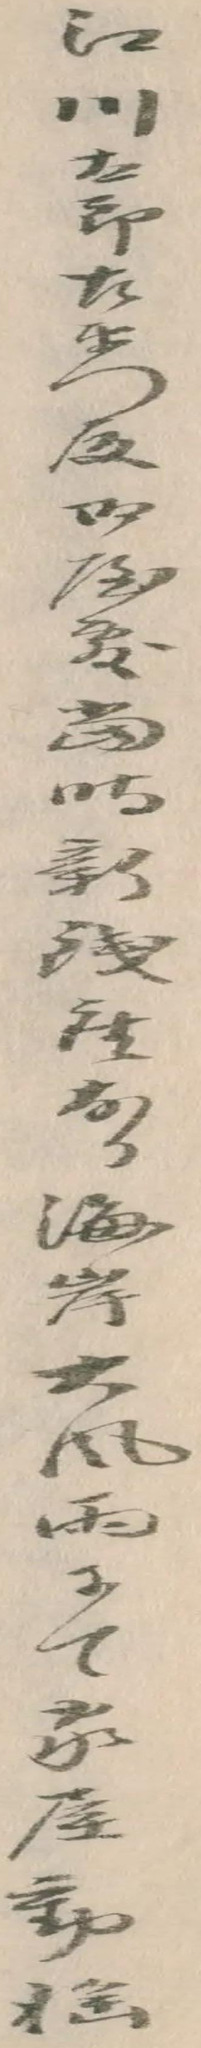江川太郎左衛門殿御屋敷当時新銭座なり海岸大風雨にて家屋動揺
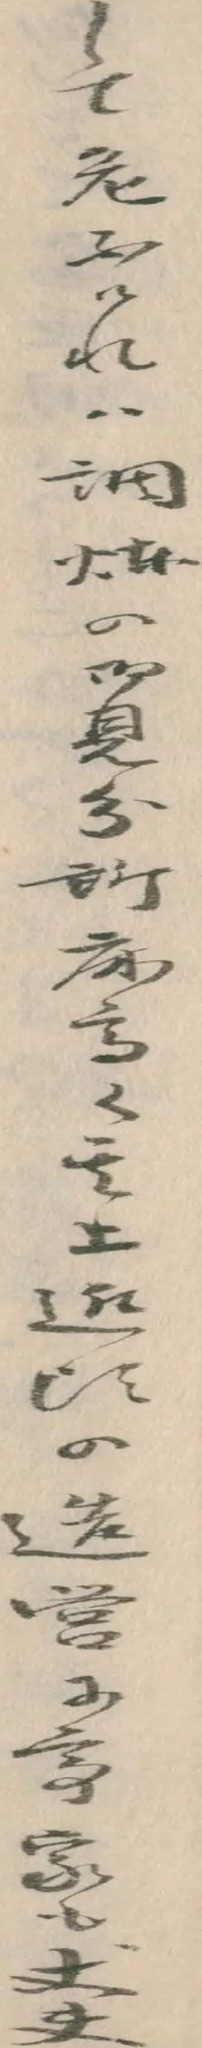して危ふけれは調煉の御見分所床高く其上近頃の造営にて家も丈夫

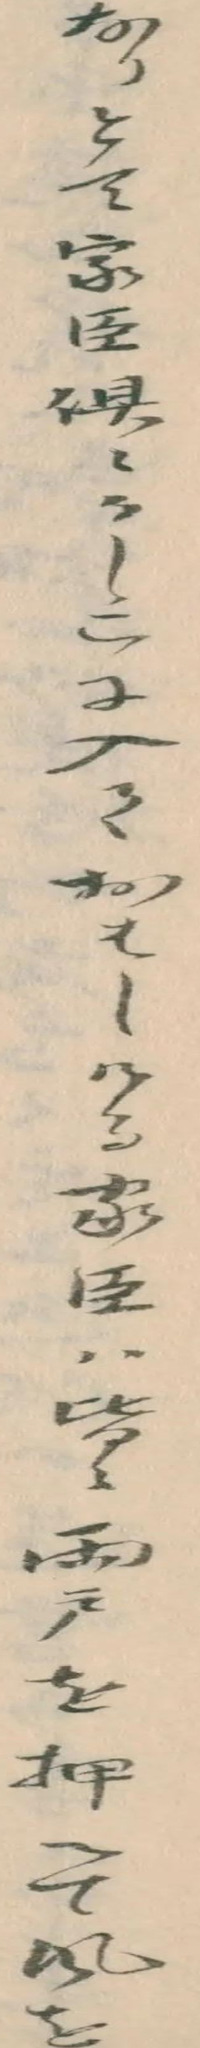なりとて家臣倶々かしこに入ておはしける家臣は皆々雨戸を押へて風を
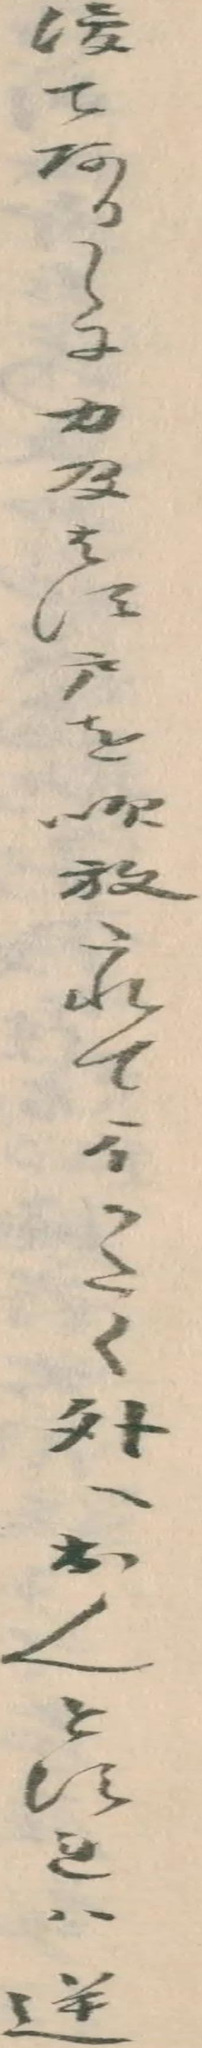凌てありしに力及はす戸を吹放たれて彳かたく外へ出んとすれは逆
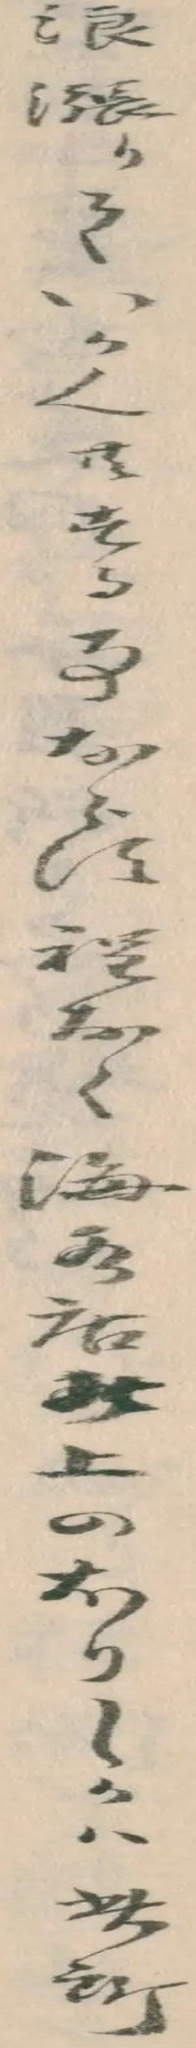浪漲りていかん共する事ならす程なく海水店の上のほりしかは此所
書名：地災撮要. 巻10(地震之部) 上,下
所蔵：国立国会図書館 National Diet Library, JAPAN
